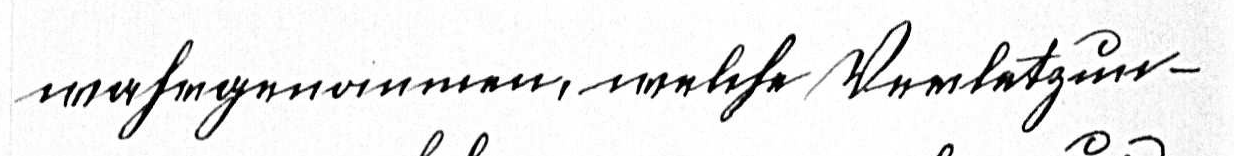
wahrgenommen, welche Verletzun¬
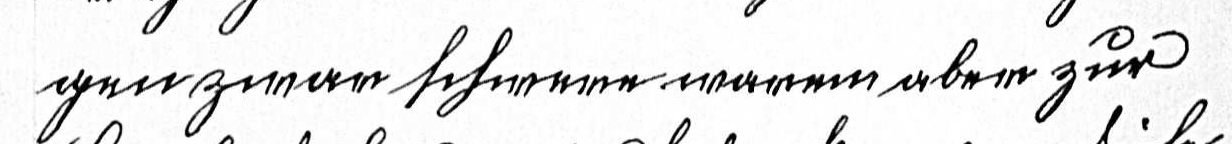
gen schwere waren aber zur
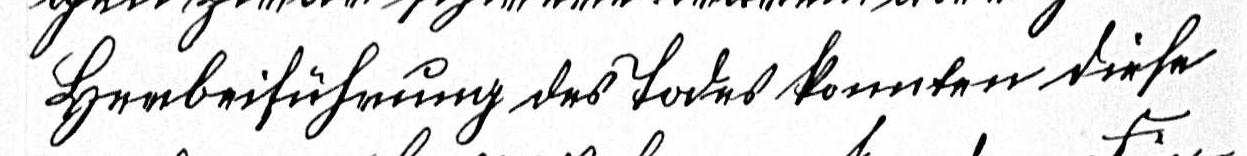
Herbeiführung des Todes konnten diese
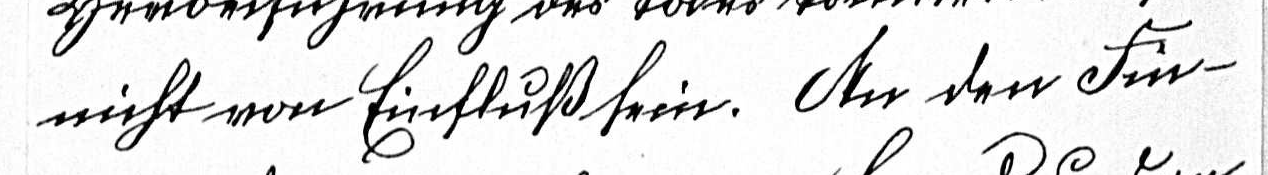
nicht von Einfluß sein. An den Fin¬
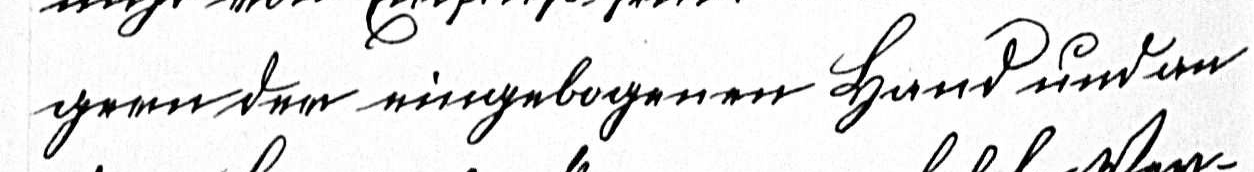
gern der eingebogenen Hand und an
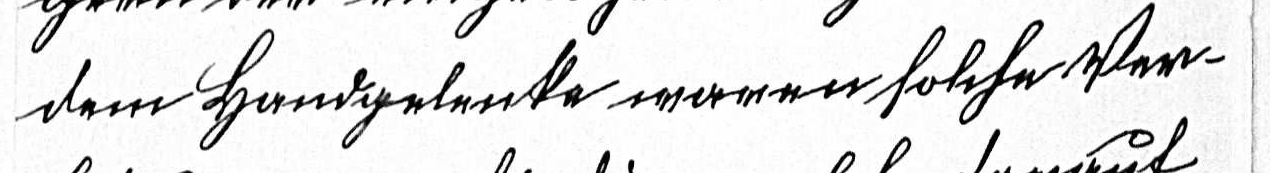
dem Handgelenke waren solche Ver¬
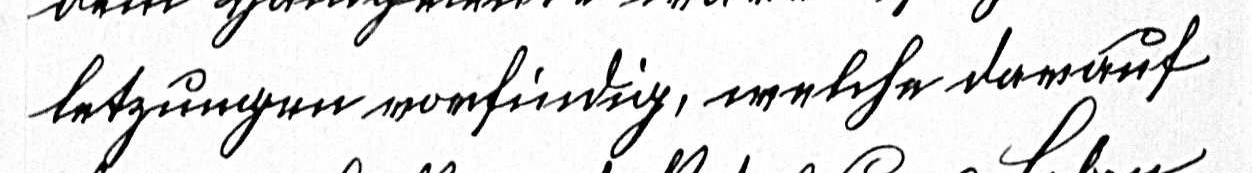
letzungen vorfindig, welche darauf
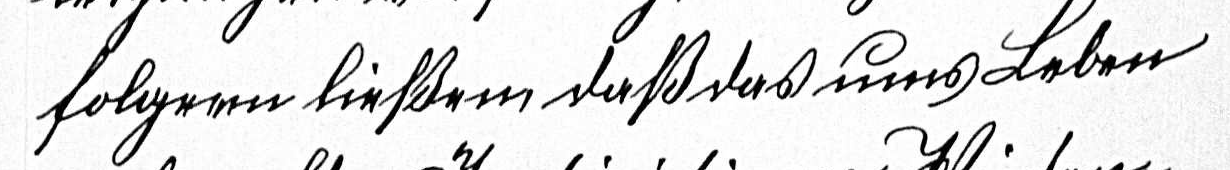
folgern ließen, daß das ums Leben
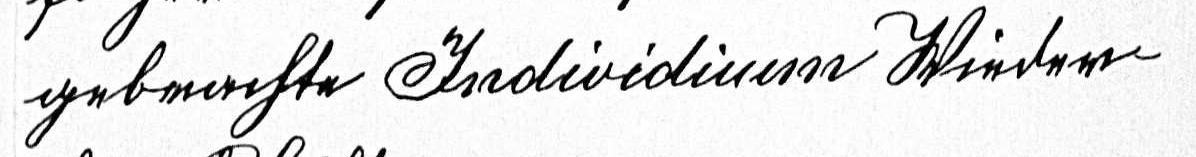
gebrachte Individium Wieder¬
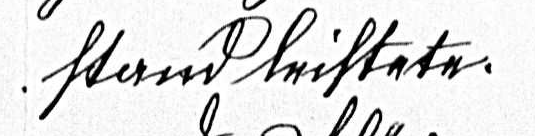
stand leistete.
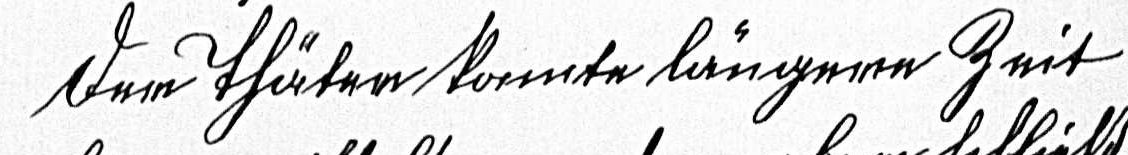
Dem Thäter konnte längere Zeit
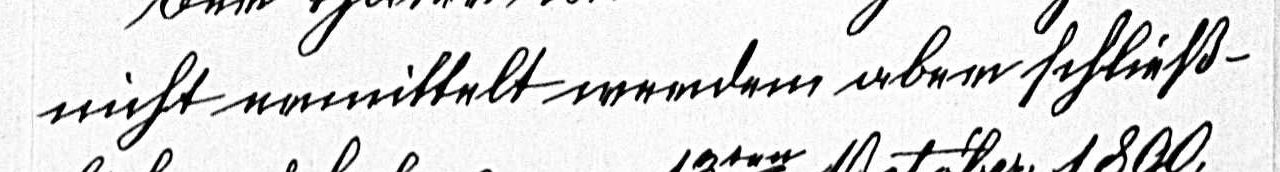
nicht ermittelt werden aber schließ¬
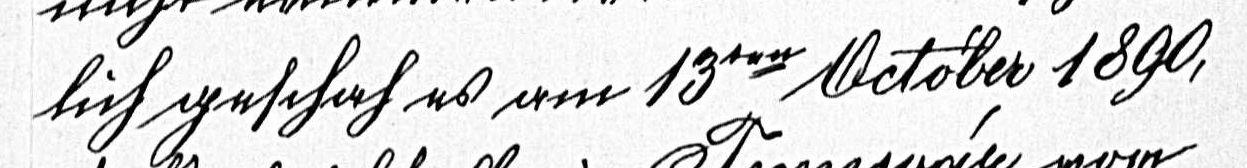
lich geschah es am 13ten October 1890,
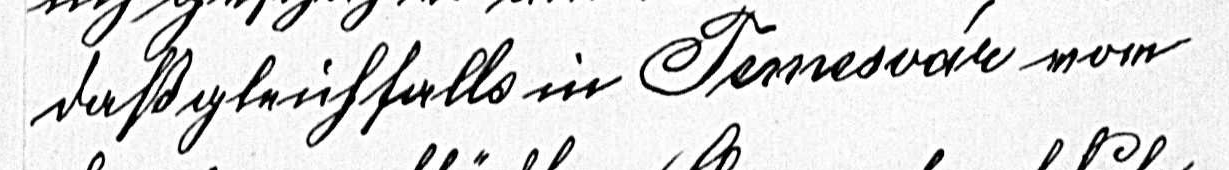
daß gleichfalls in Temesvár vor
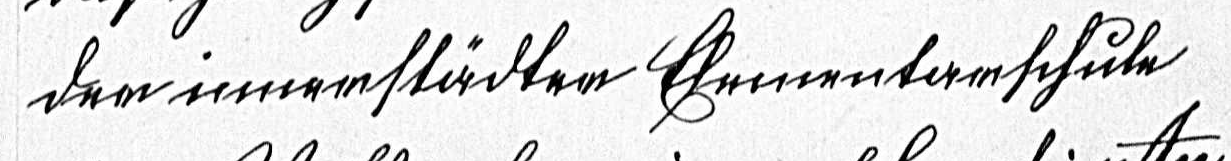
der innerstädter Elementarschule
